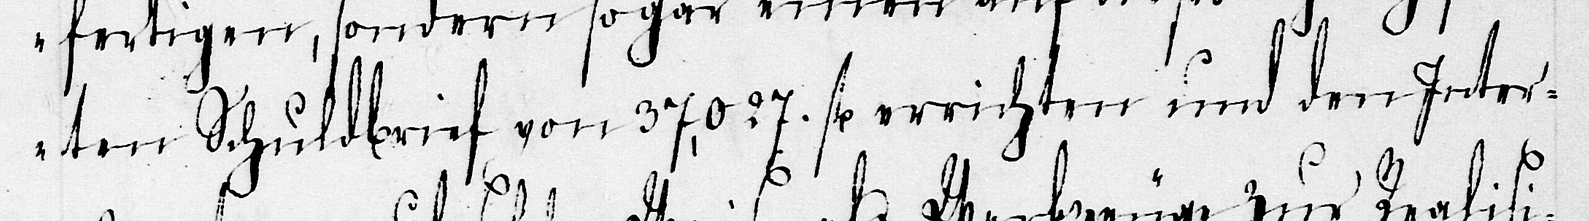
lten Schuldbrief von 37,027. fl. errichten und den Inter¬
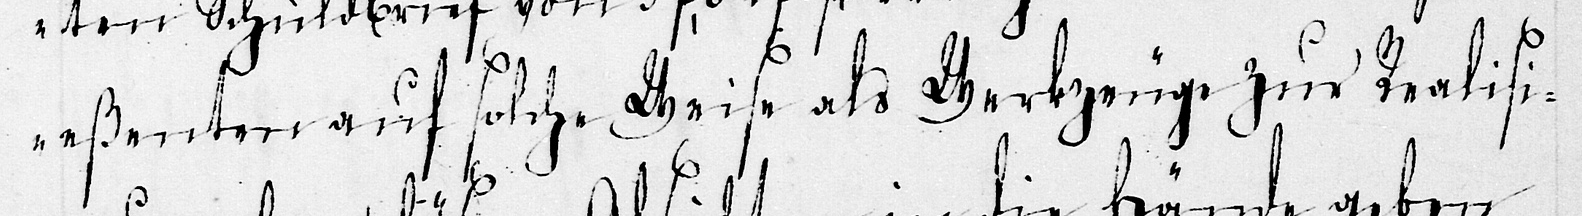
eßenten auf solche Weise als Werkzeuge zur Realisi¬
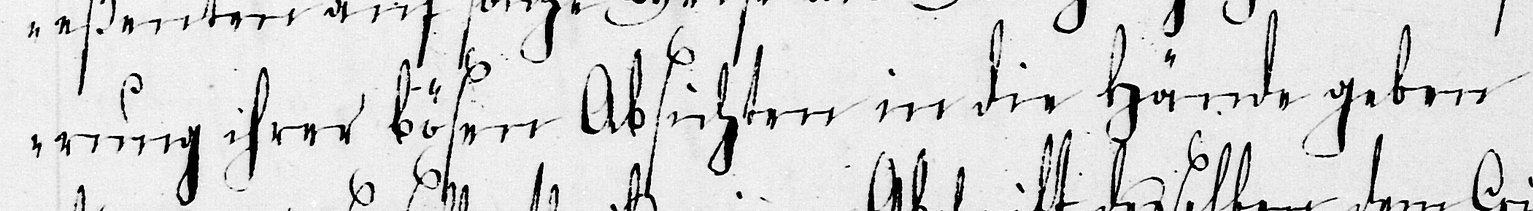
rung ihrer bösen Absichten in die Hände geben
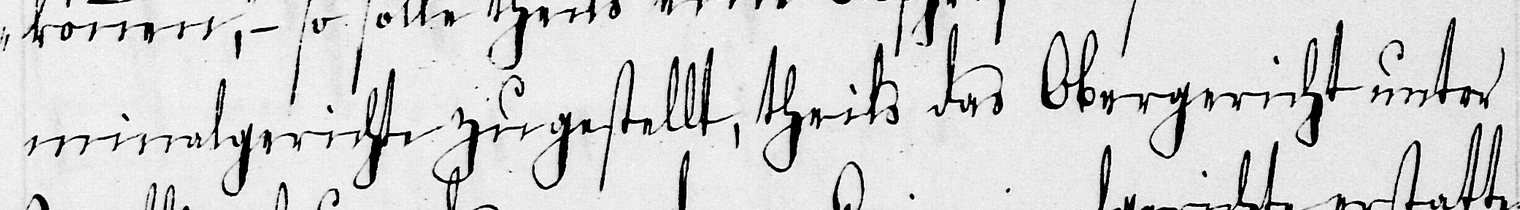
minalgerichte zugestellt, theils das Obergericht unter
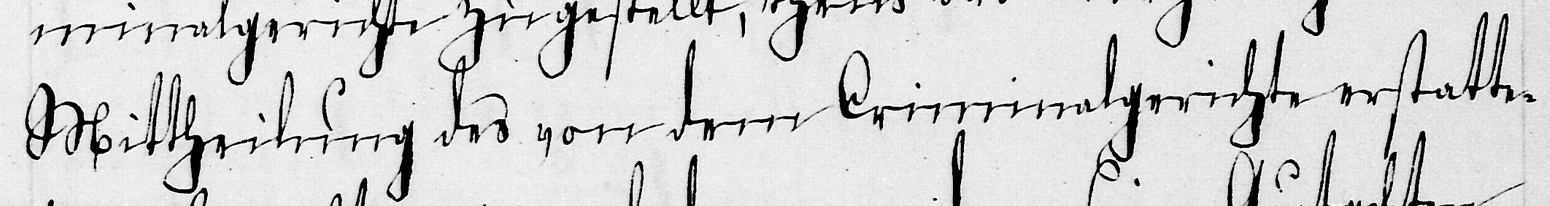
Mittheilung des von dem Criminalgerichte erstatte¬
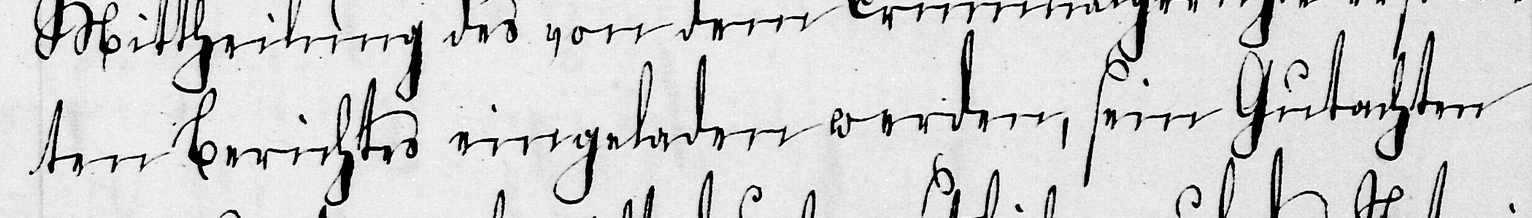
ten Berichtes eingeladen werden, sein Gutachten
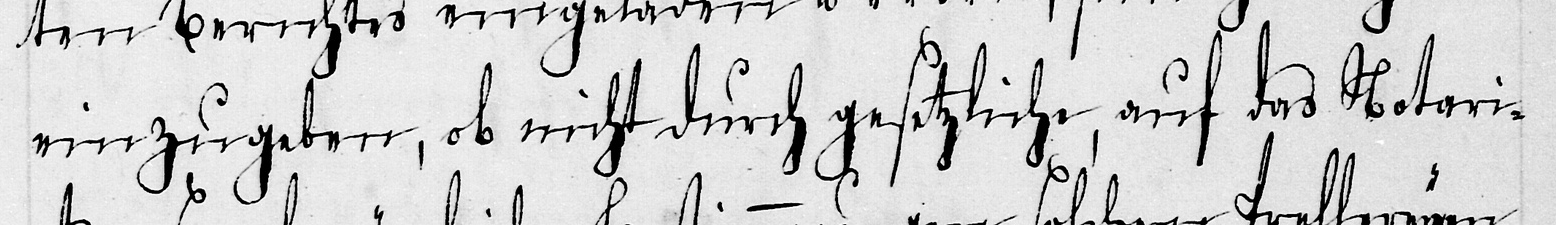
einzugeben, ob nicht durch gesetzliche, auf das Notari¬
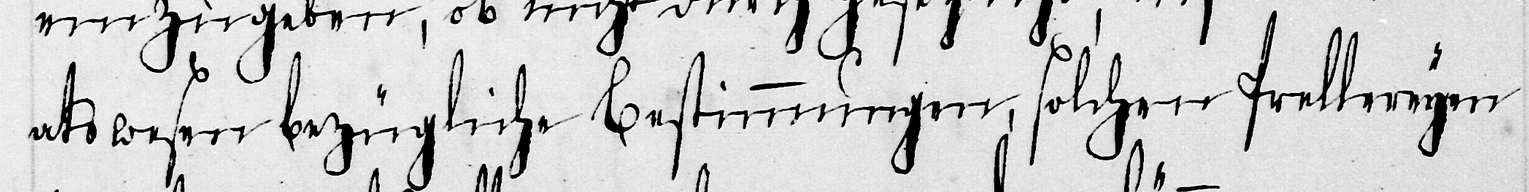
atswesen bezügliche Bestimmungen, solchen Prellereyen
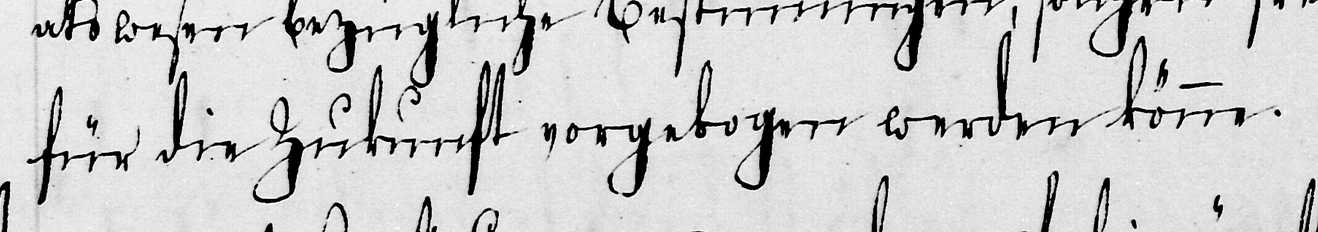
für die Zukunft vorgebogen werden könne.
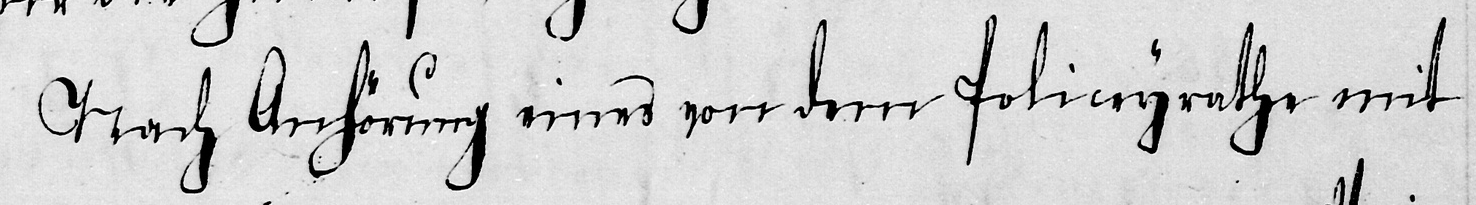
Nach Anhörung eines von dem Policeyrathe mit
